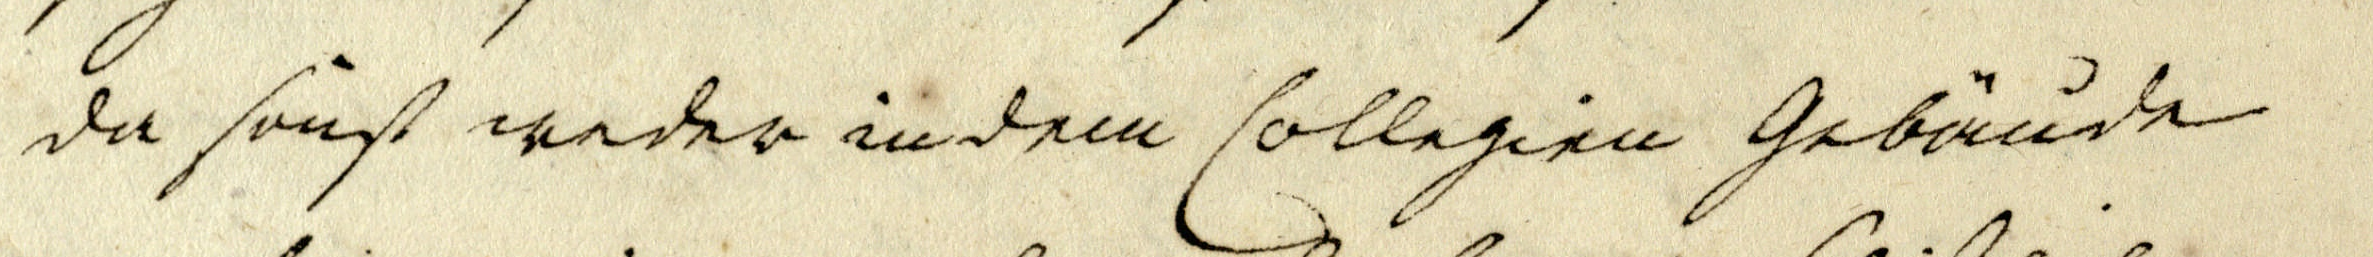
da sonst weder in dem Collegien Gebäude
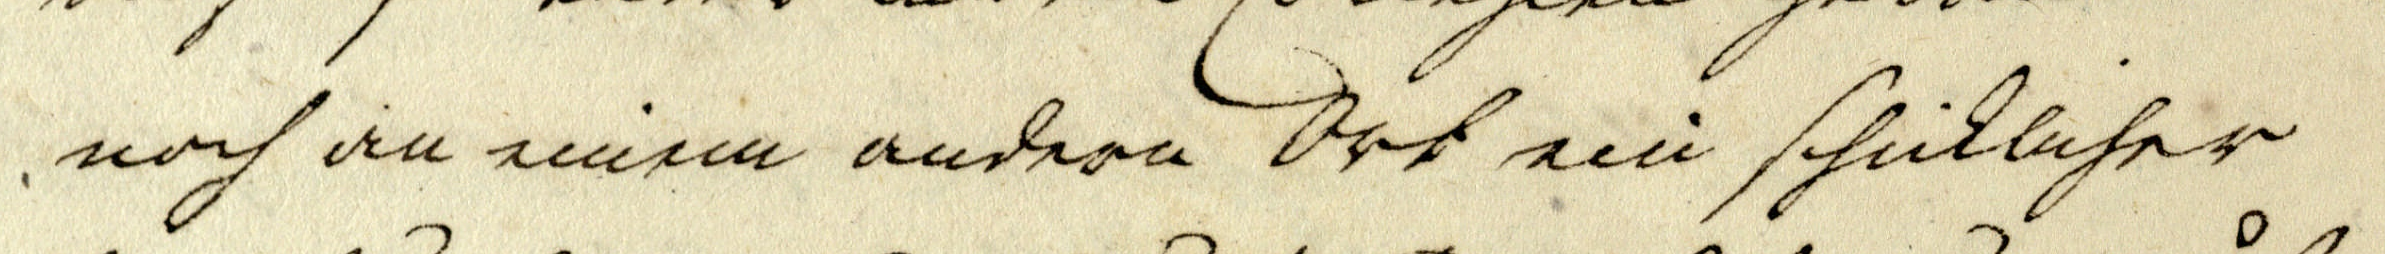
noch an einem andern Ort ein schicklicher
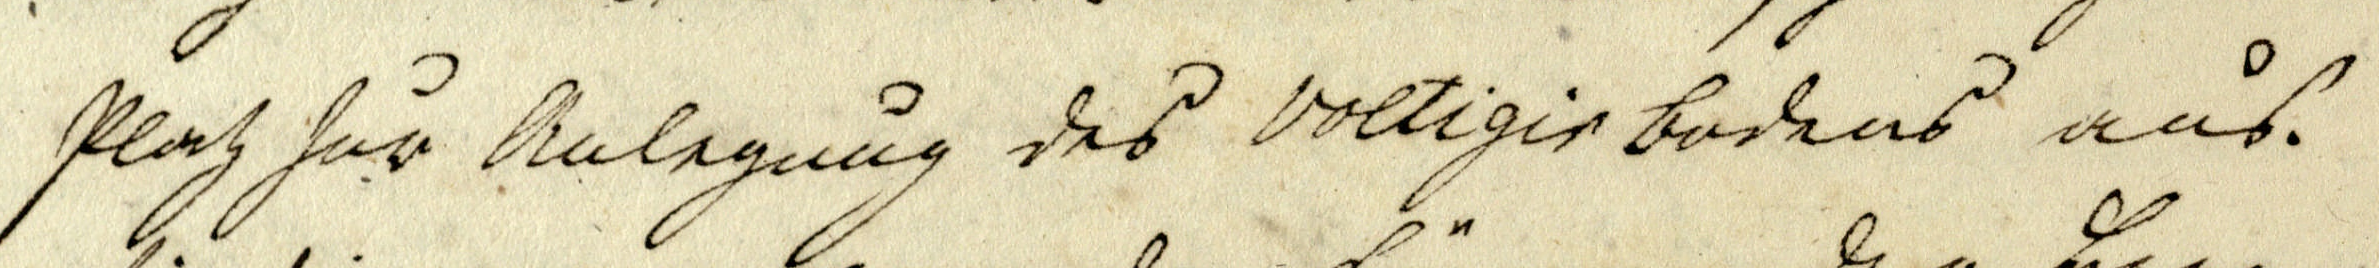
Platz zur Anlegung des Voltigirbodens aus¬
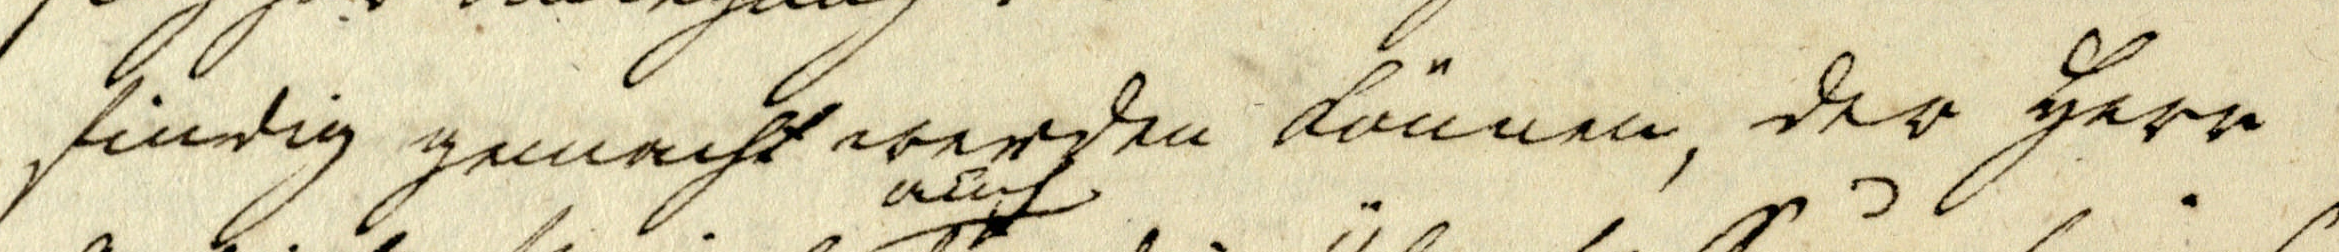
findig gemacht werden können, der Herr
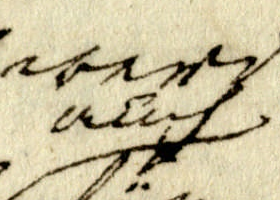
auch
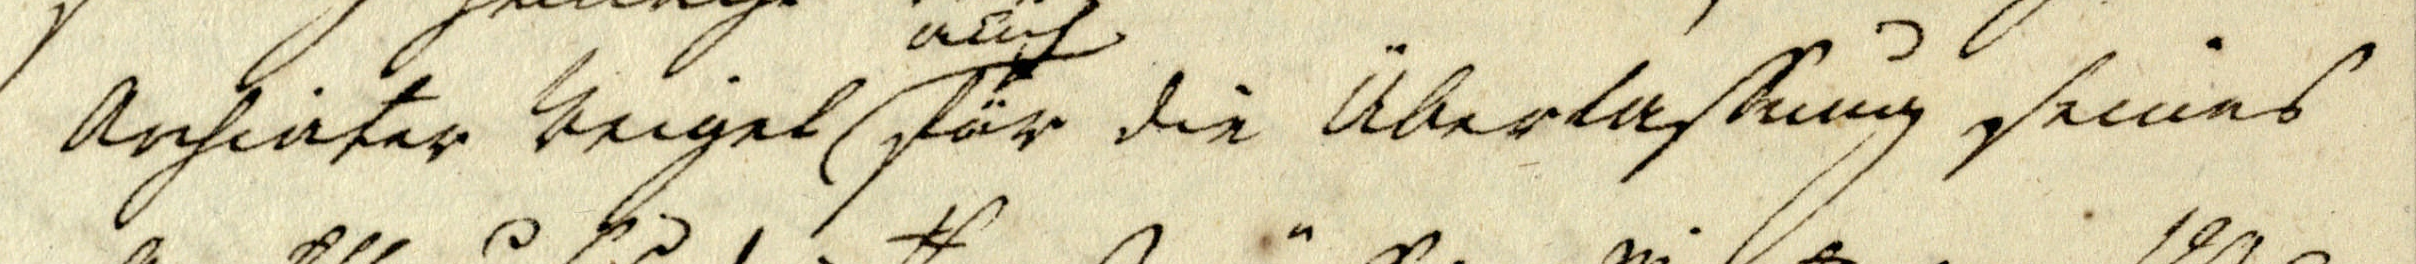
Archiater Weigel für die Überlassung seines
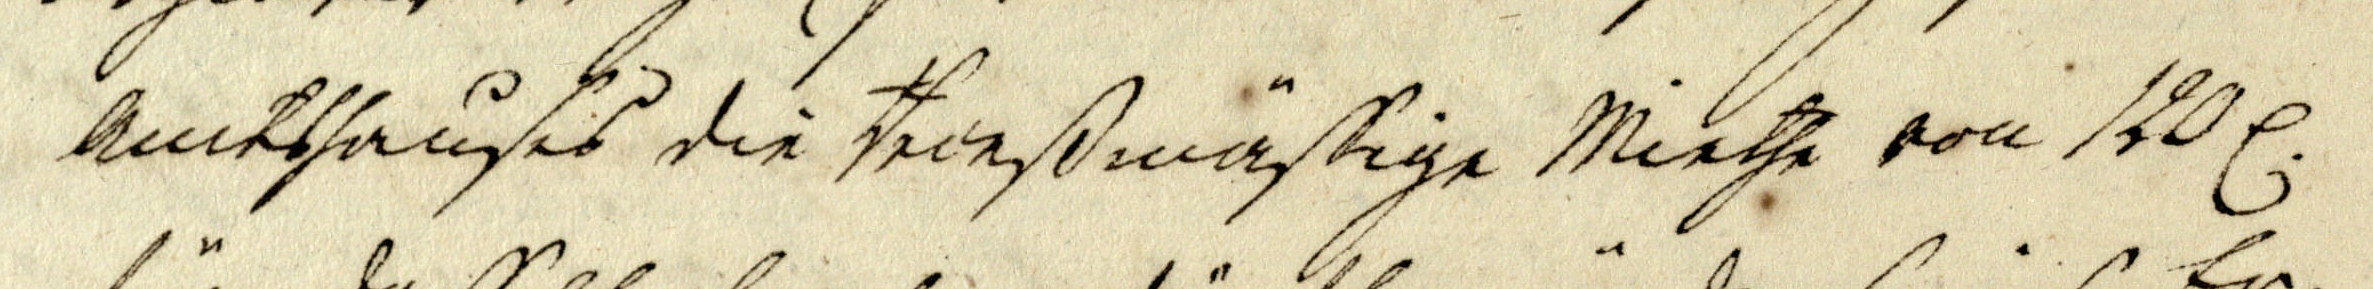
Amtshauses die Recessmässige Miethe von 120 l.
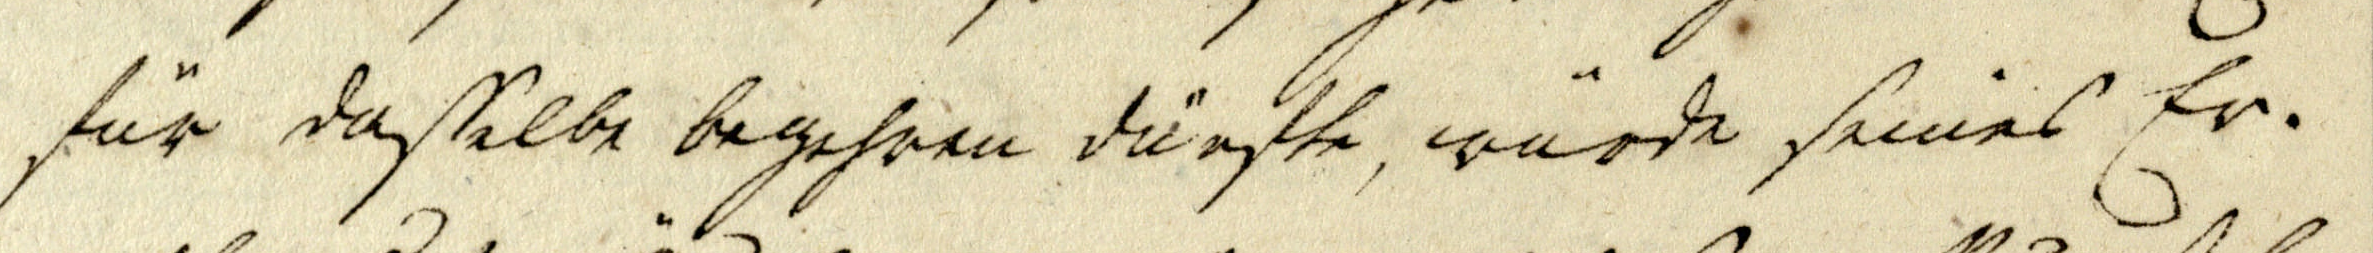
für dasselbe begehren dürfte, würde seines Er¬
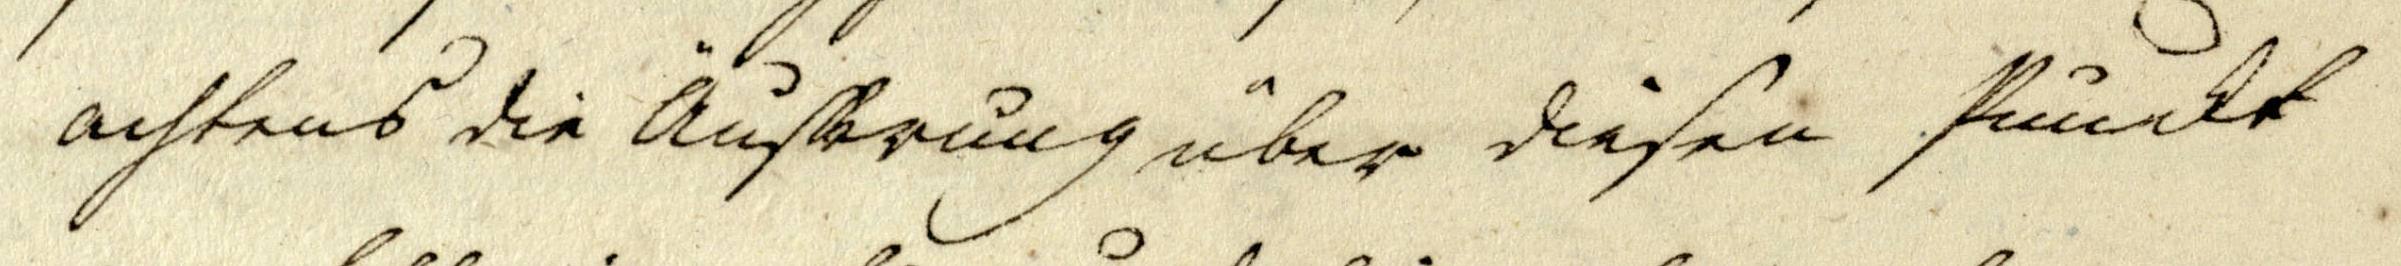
achtens die Äusserung über diesen Punckt
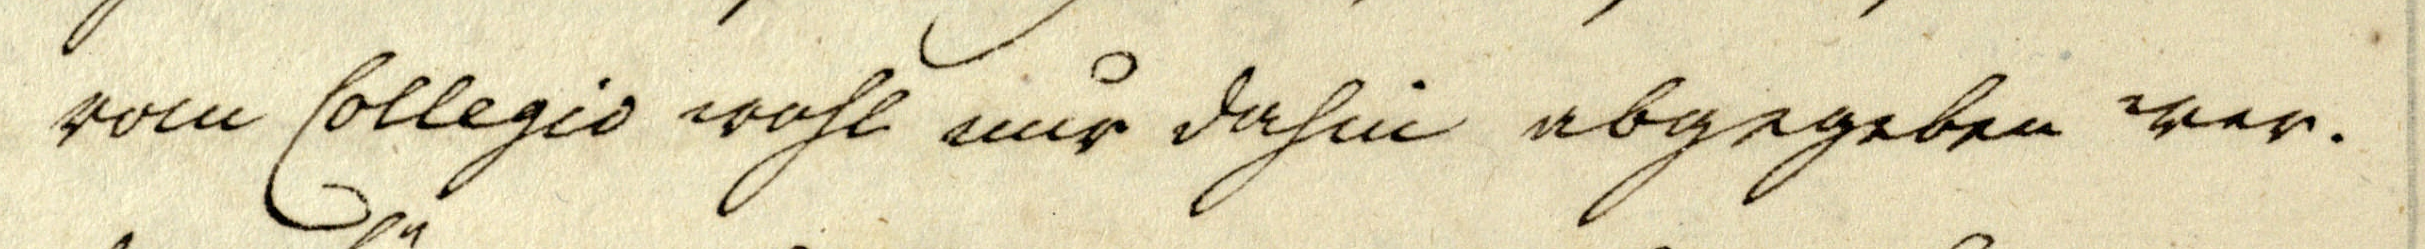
vom Collegio wohl nur dahin abgegeben wer¬
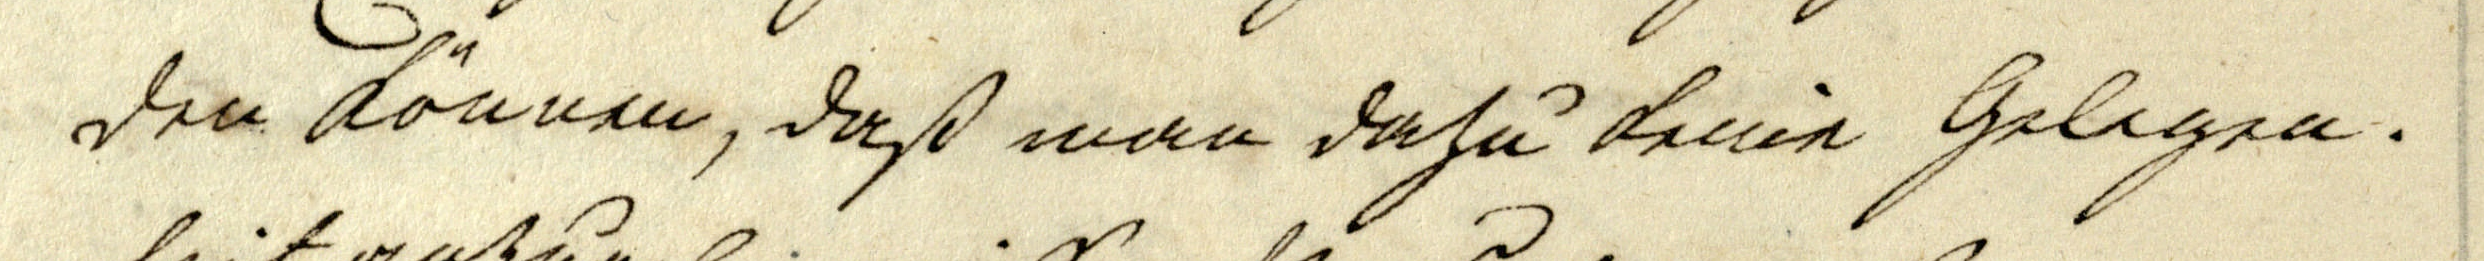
den können, daß man dazu keine Gelegen¬
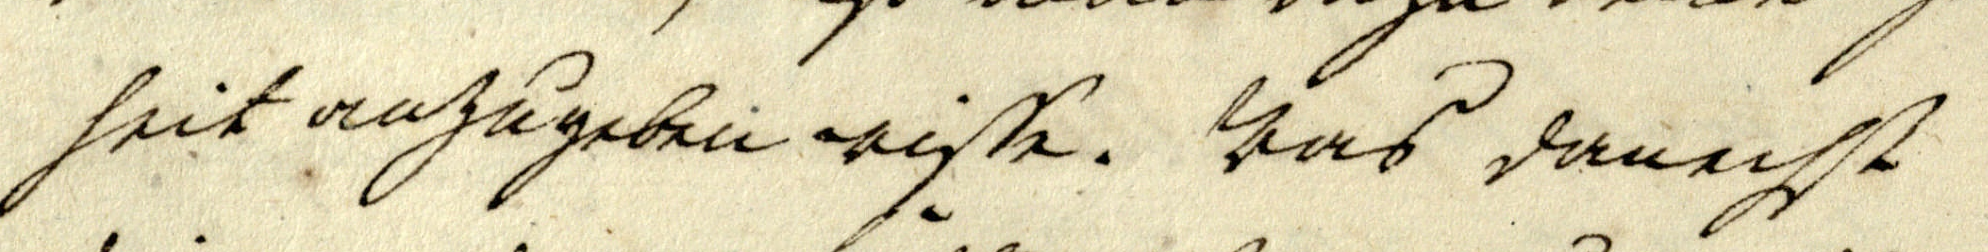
heit anzugeben wisse. Was danechst
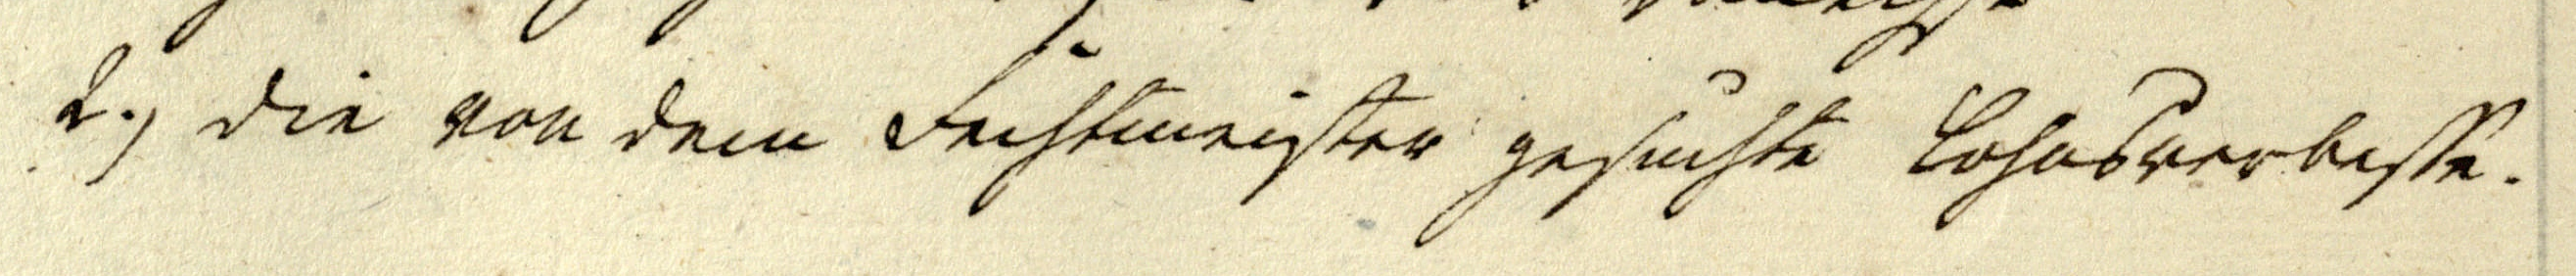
2., die von dem Fechtmeister gesuchte Lohnsverbesse¬
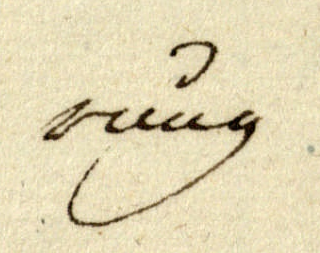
rung
